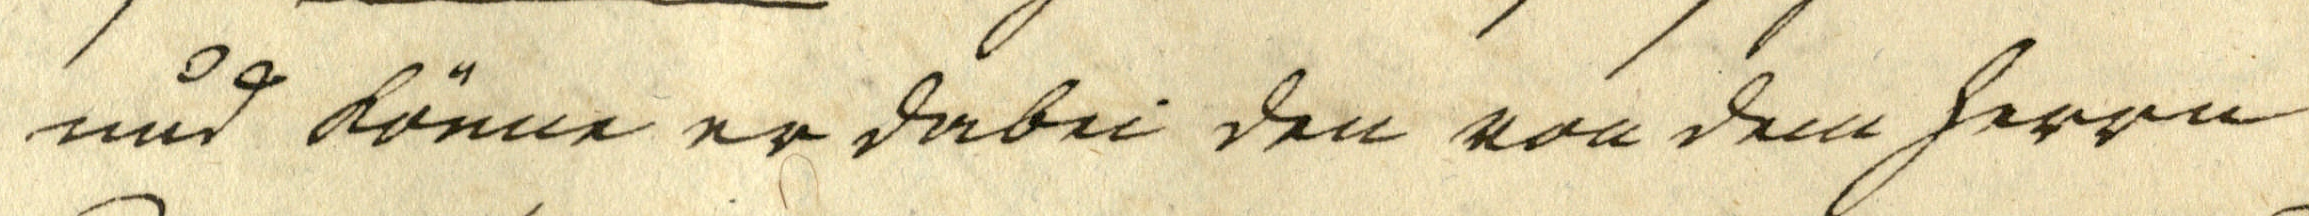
und könne er dabei den von dem Herrn
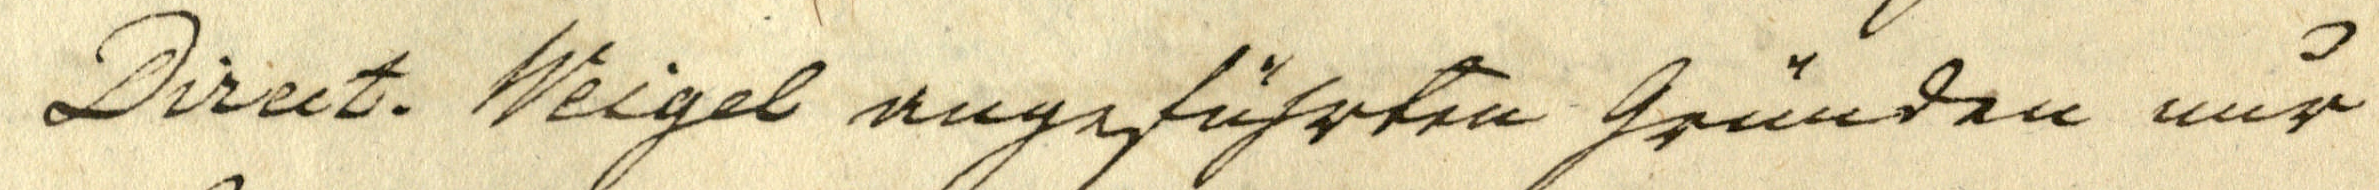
Direct. Weigel angeführten Gründen nur
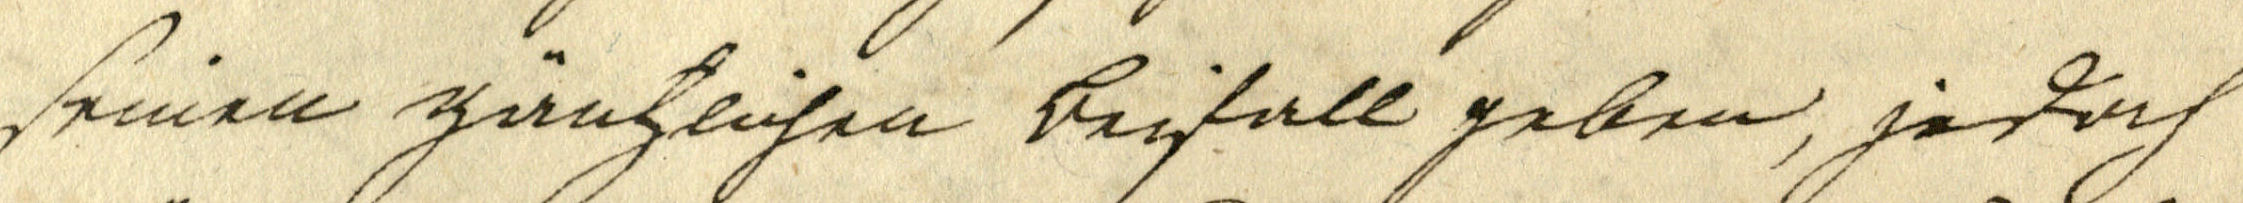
seinen gäntzlichen Beifall geben, jedoch
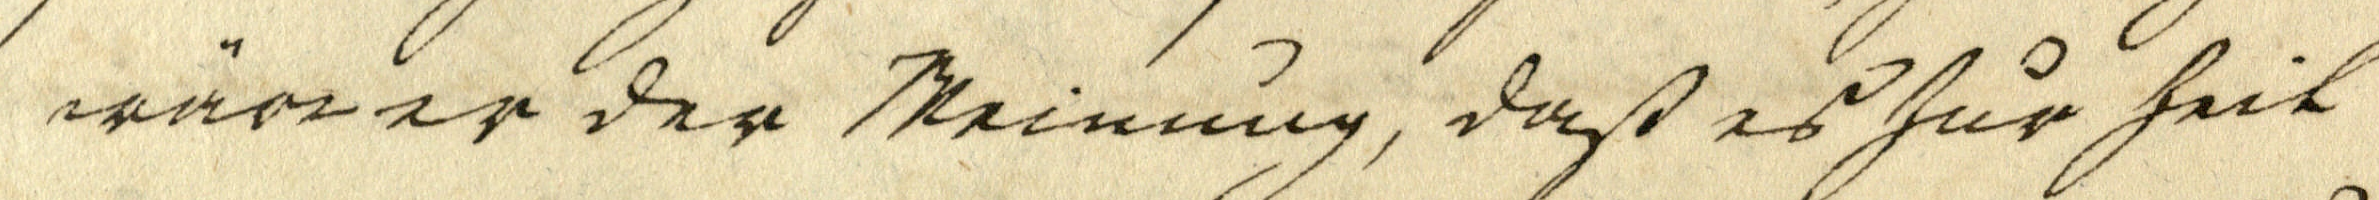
wäre er der Meinung, daß es zur Zeit
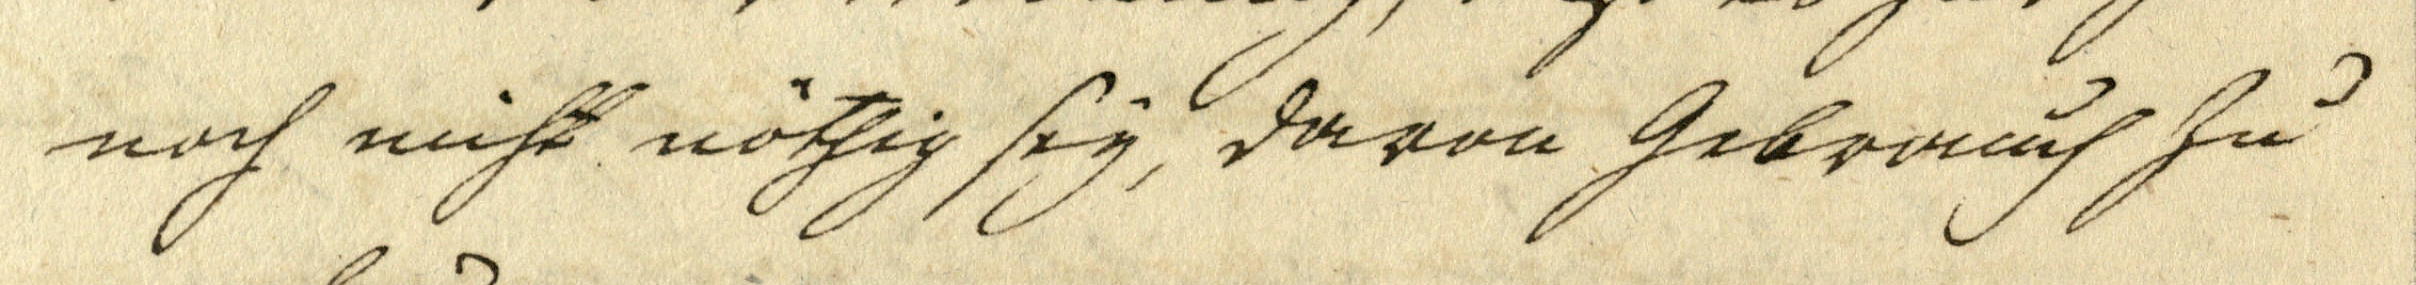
noch nicht nöthig seÿ, davon Gebrauch zu
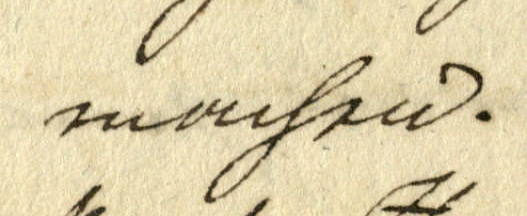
machen.
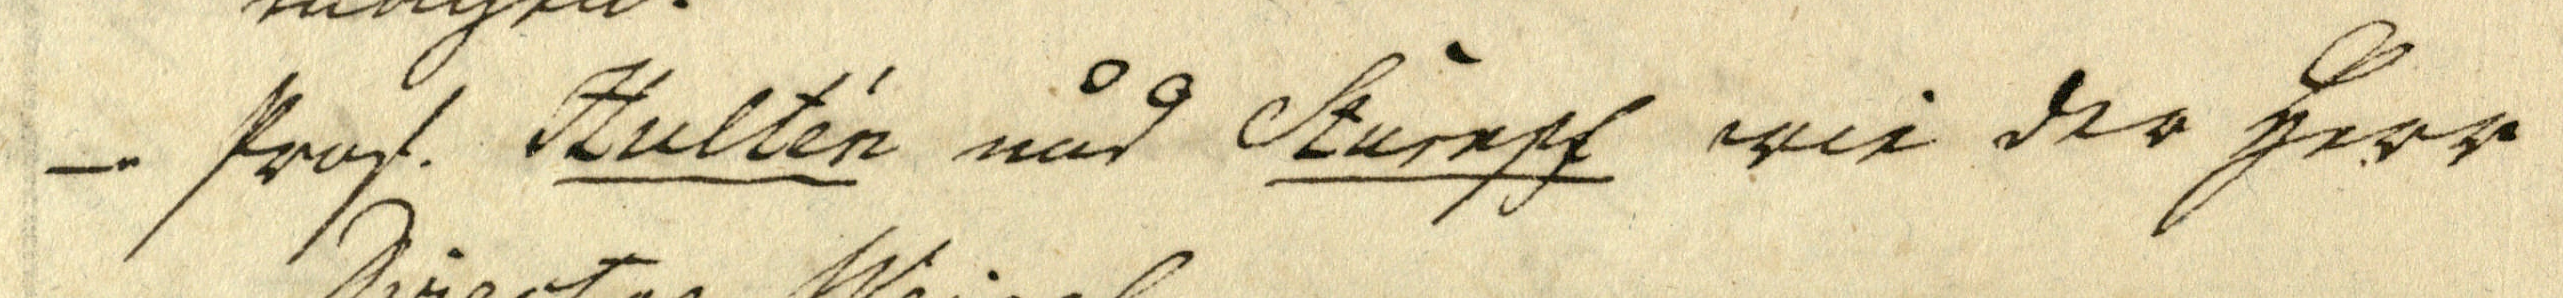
Prof. Hultén und Stumpf wie der Herr
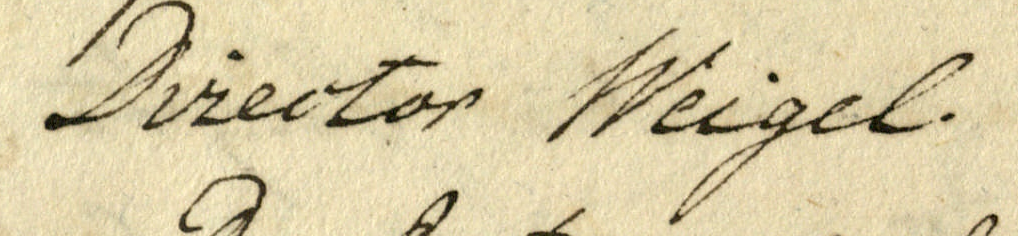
Director Weigel.
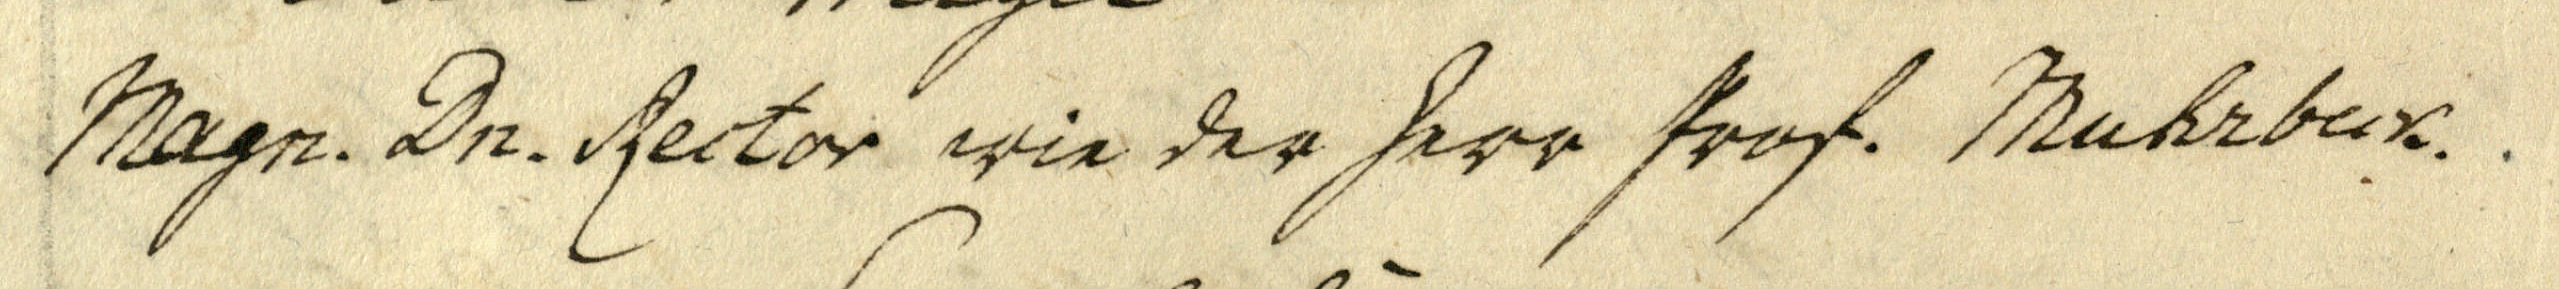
Magn. Dn. Rector wie der Herr Prof. Muhrbeck.
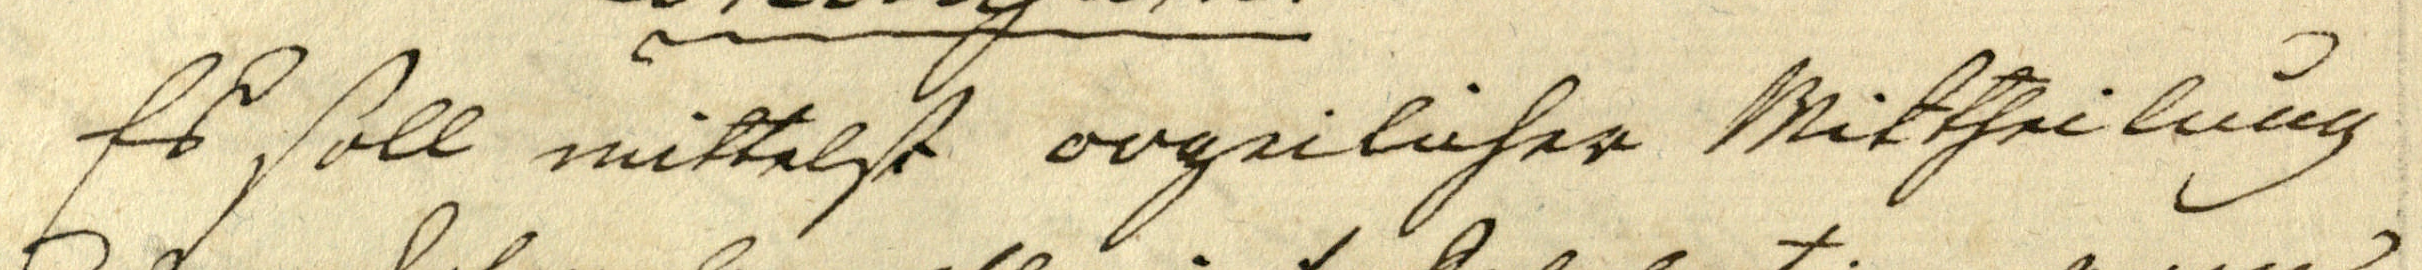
Es soll mittelst copeilicher Mittheilung
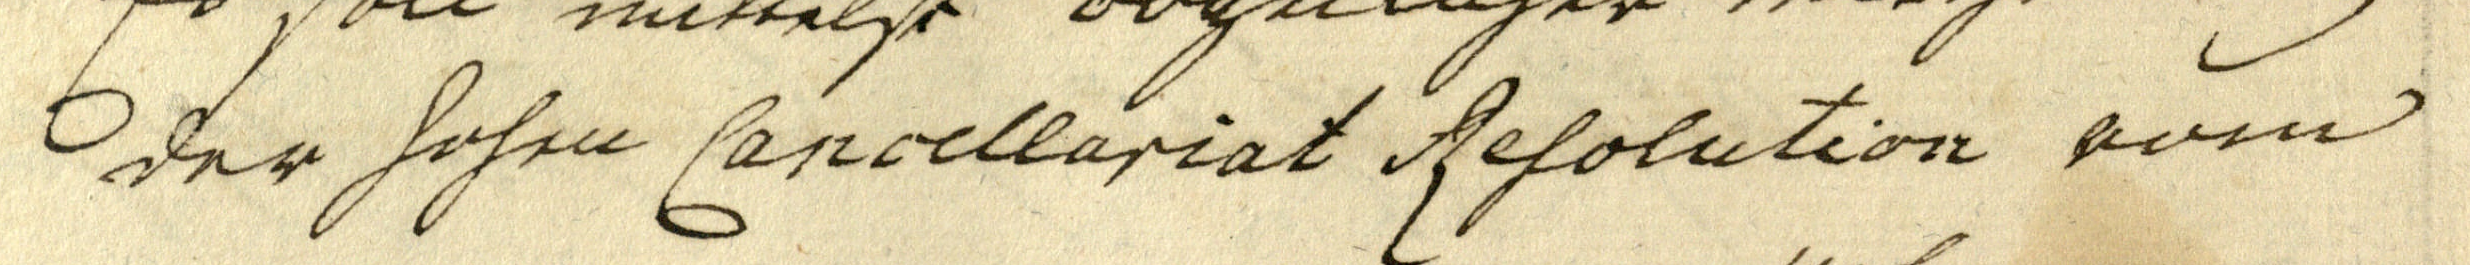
der hohen Cancellariat Resolution vom
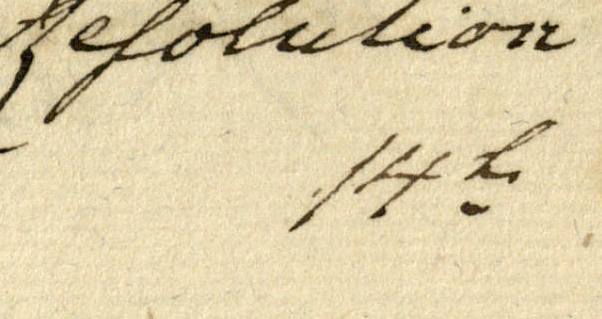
14 t.
